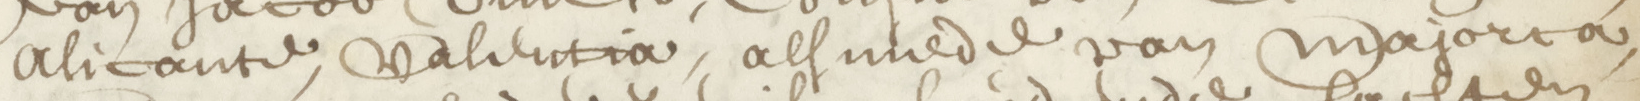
alicante, Valentia, alsmede van Majorca,
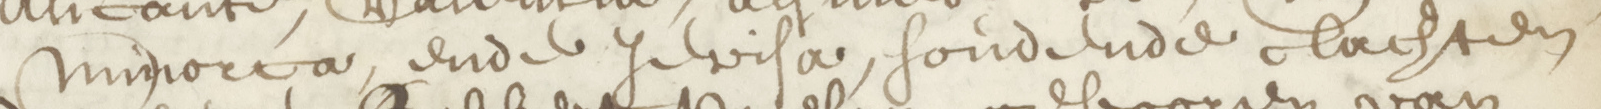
Minorca, ende Ievisa, houdende clachten
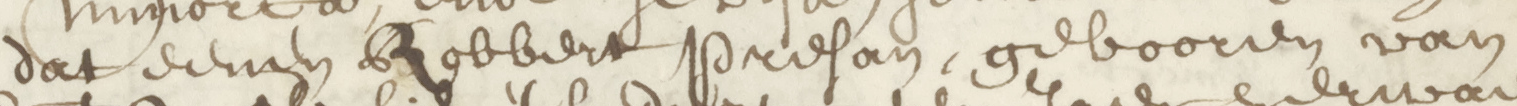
dat eenen Robbert Presan, gebooren van
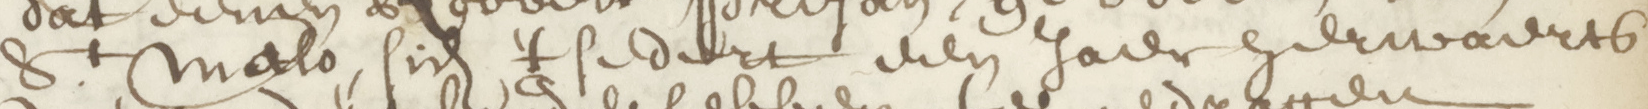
St. Malo sich 't sedert een Jaer herwaerts
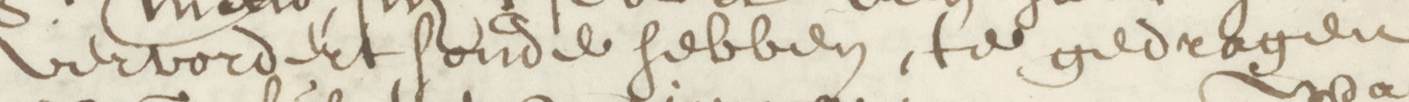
vervordert soude hebben, te gedragen
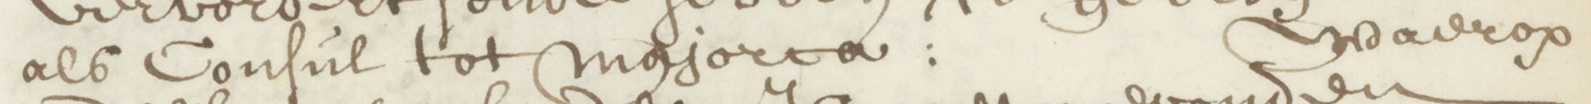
als Consul tot Majorca: Waerop
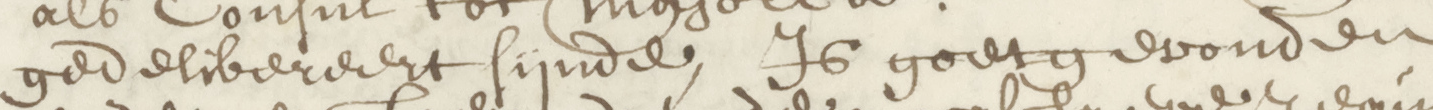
gedelibereert sijnde, Is goetgevonden
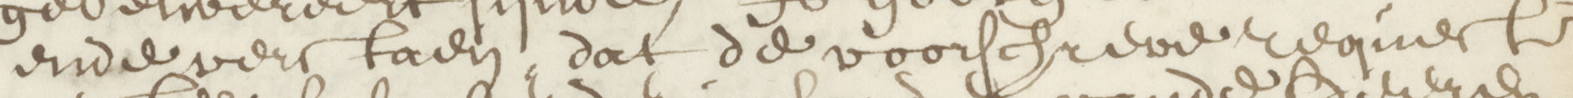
ende verstaen, dat de voorschreve requeste
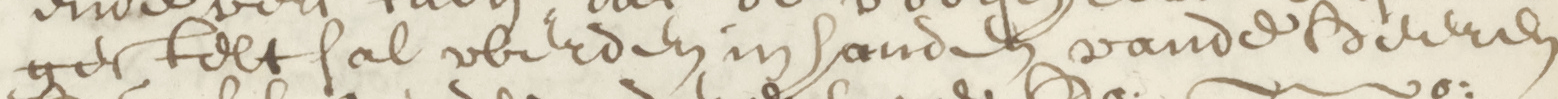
gestelt sal werden in handen vande Heeren
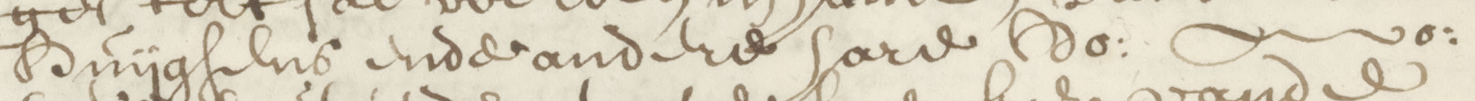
Huijghens ende andere hare Ho:Mo:
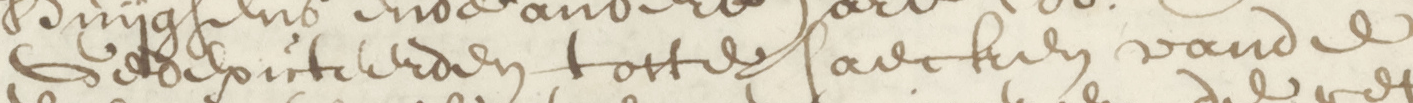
Gedeputeerden totte saecken vande
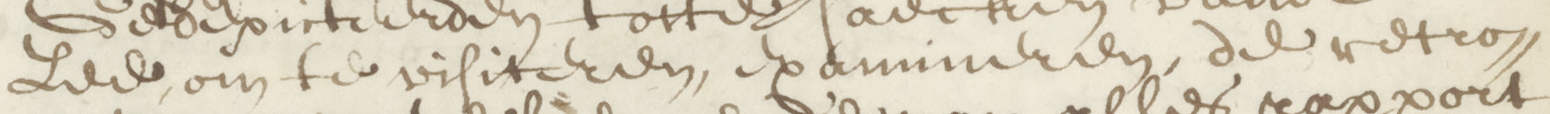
Zee, om te visiteren, examineren, de retro,,
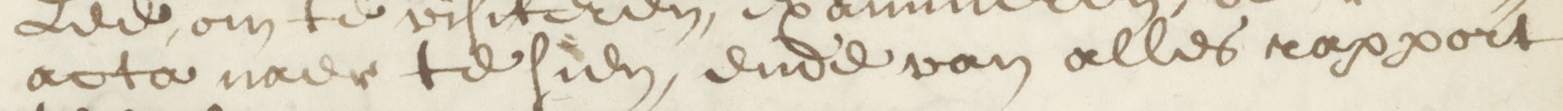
acta naer te sien, ende van alles rapport
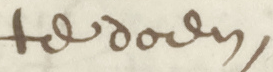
te doen.
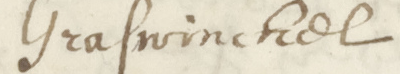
Graswinckel
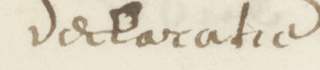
declaratie
